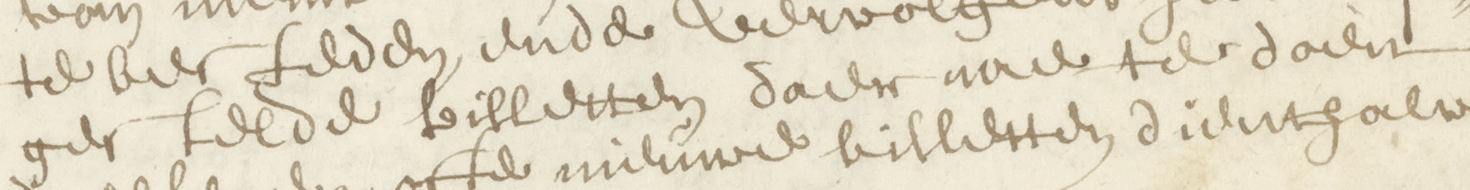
gestelde billetten daer nae te doen
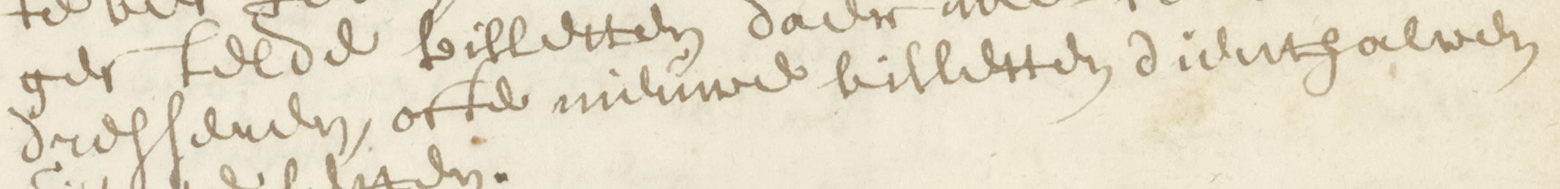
dresseren, ofte nieuwe billetten dienthalven
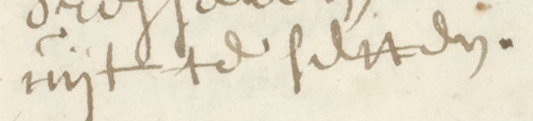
uijt te setten.
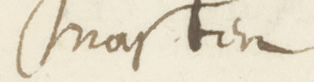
Masten
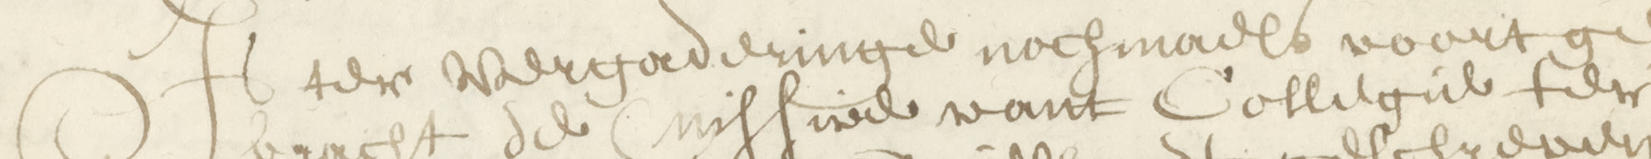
Is ter vergaderinge nochmaels voortge„
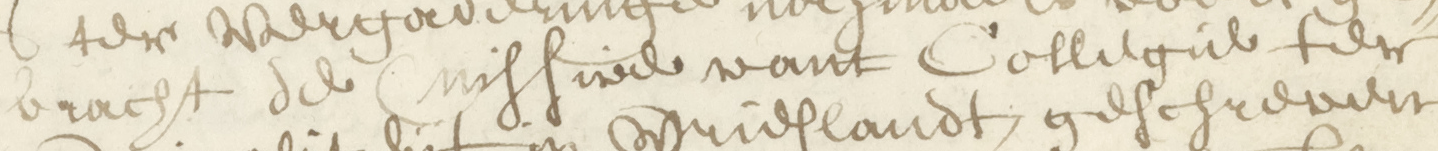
bracht de missive vant Collegie ter
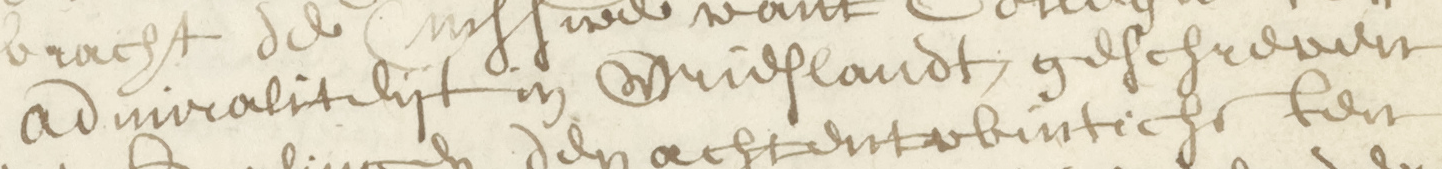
Admiraliteijt in Vrieslandt, geschreven
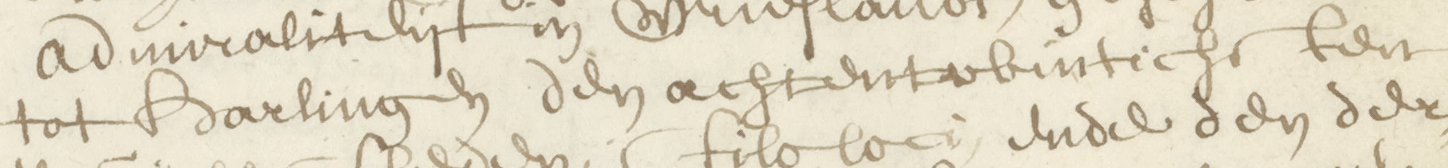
tot Harlingen den achtentwintichsten
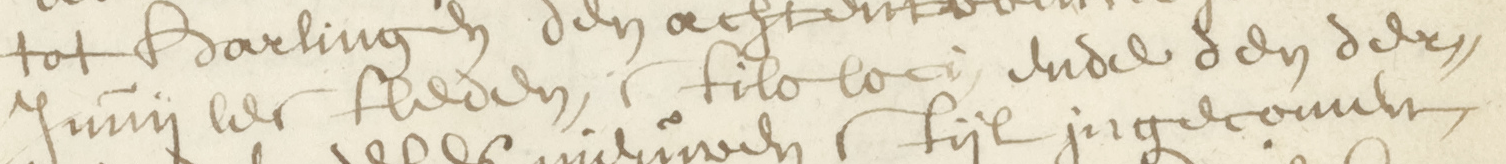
Junij lestleden, stilo loci, ende den der„
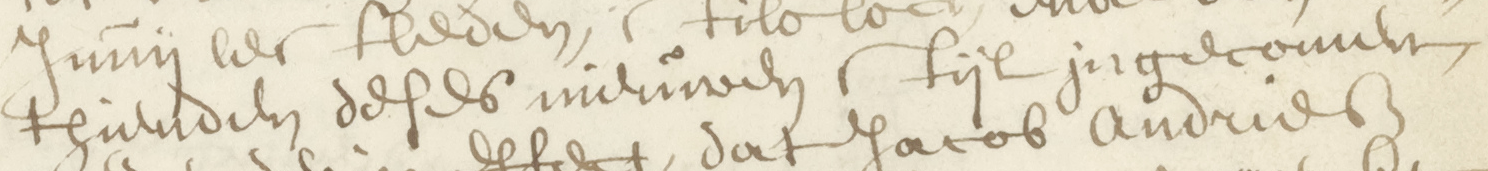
thienden deses nieuwen stijl ingecomen,
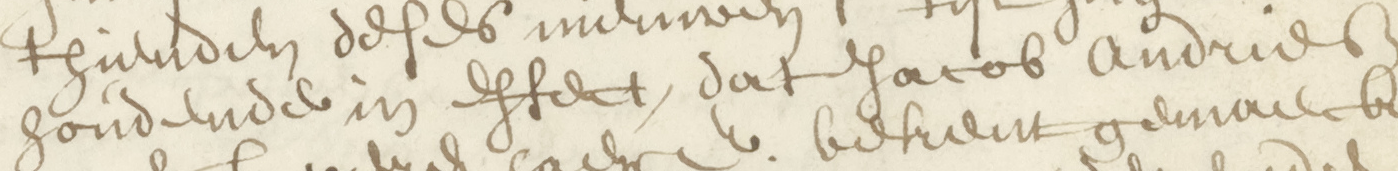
houdende in effect, dat Jacob Andries
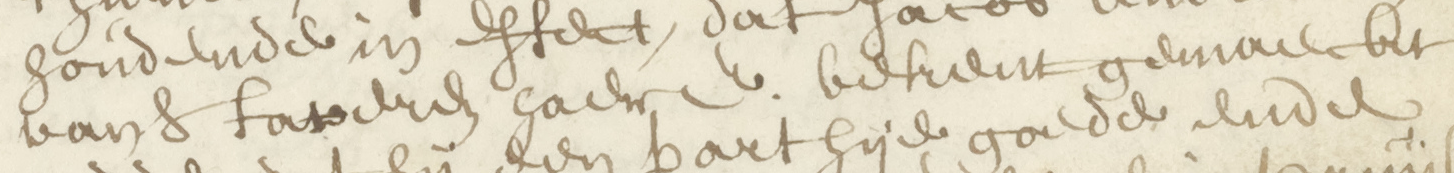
van Staveren haer E. bekent gemaeckt
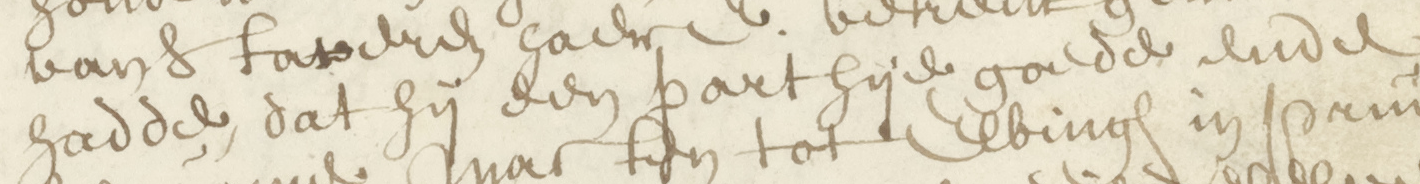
hadde, dat hij een parthije goede ende
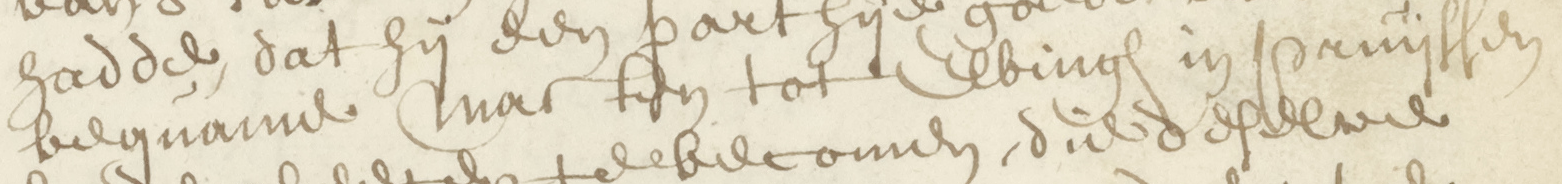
bequame masten tot Elbingh in Pruijssen
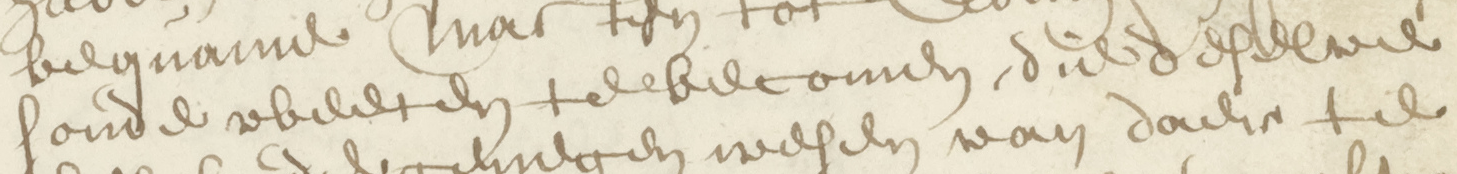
soude weeten te becomen, die deselve
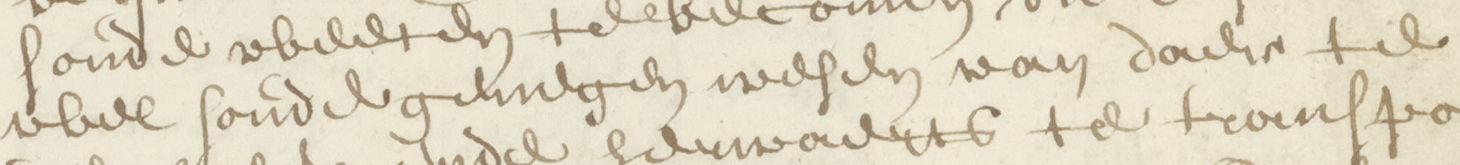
wel soude genegen wesen van daer te
